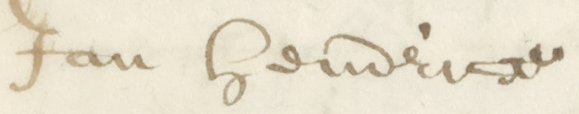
Jan Hendricx
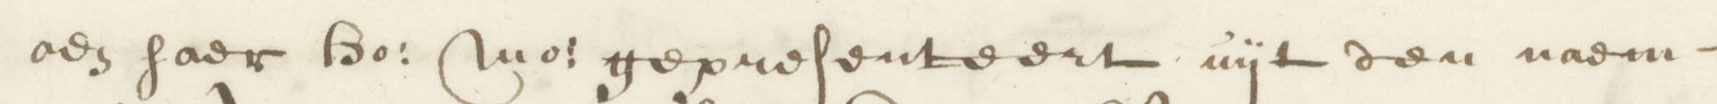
aen haer ho:Mo: gepresenteert uijt den naem
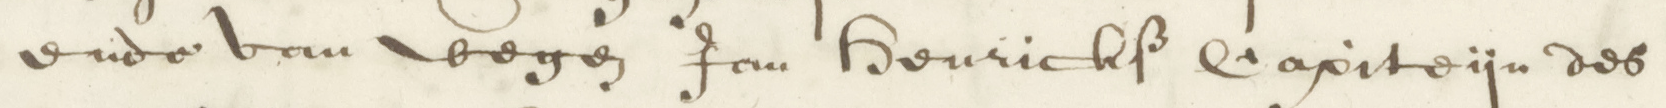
ende van wegen Jan Henricks Capiteijn des
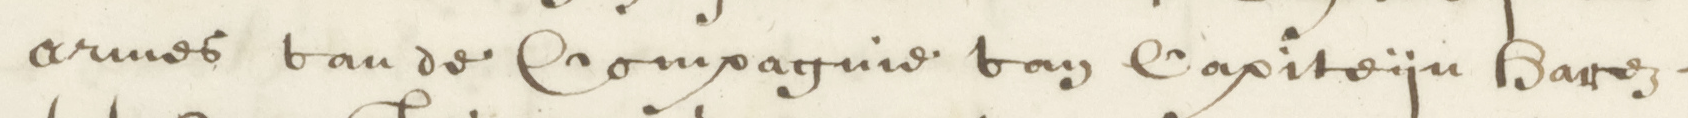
armes van de Compagnie van Capiteijn Haren
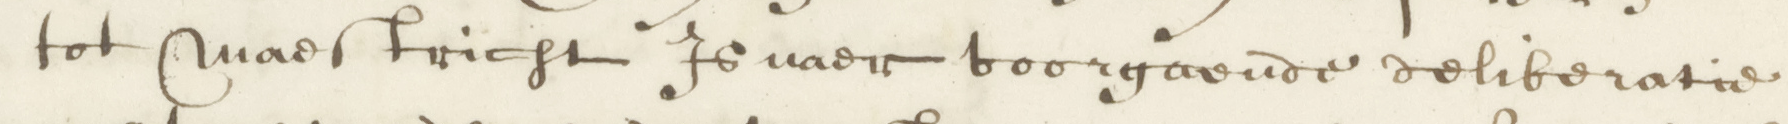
tot maestricht Is naer voorgaende deliberatie
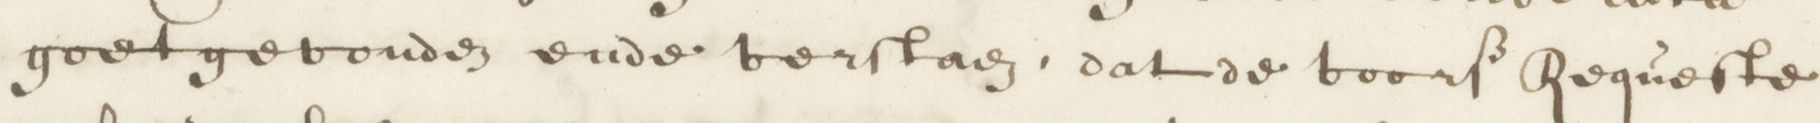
goetgevonden ende verstaen, dat de voors Requeste
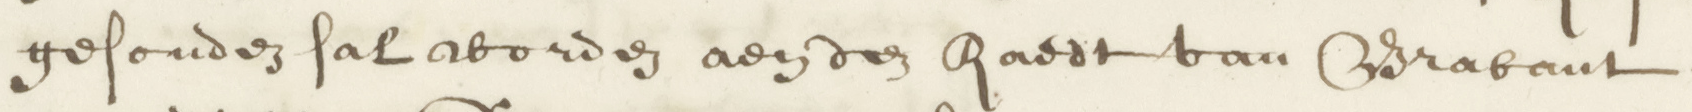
gesonden sal worden aen den Raedt van Brabant
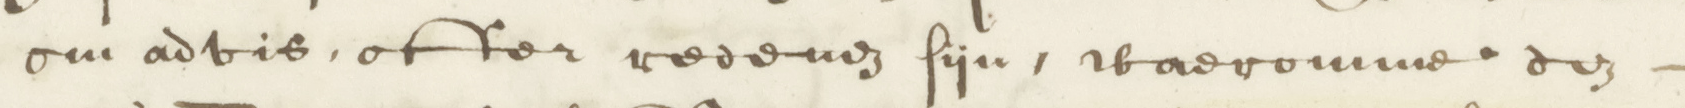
om advis, ofter redenen sijn, waecomme den
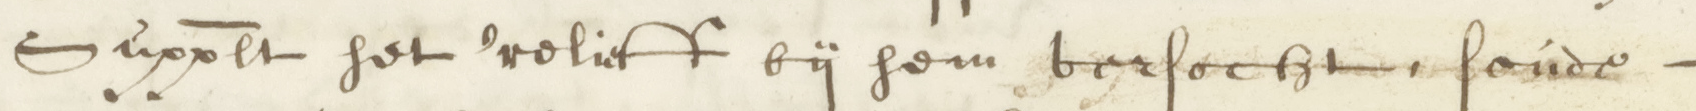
Supplt het relieff bij hem versochte, soude
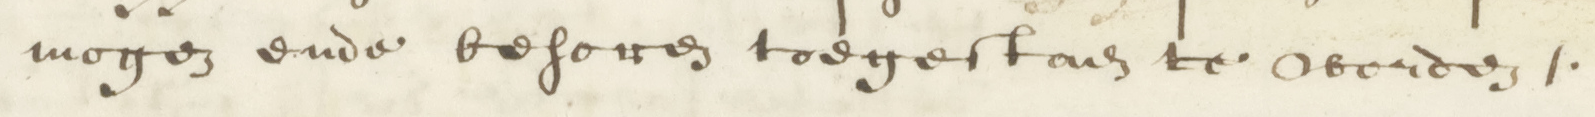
mogen ende behoren toegestaen te worden.
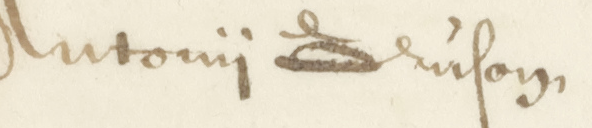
Antonij Gruson
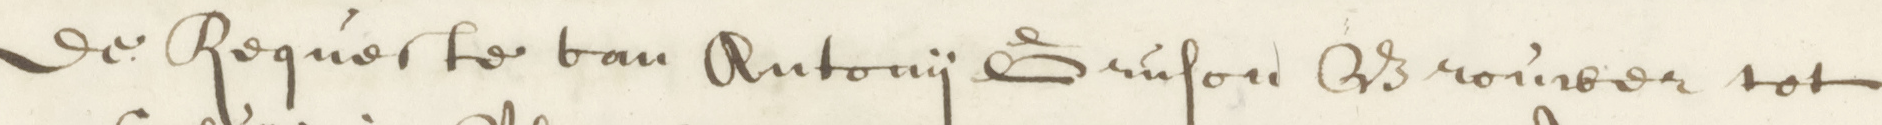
De Requeste van Antonij Gruson Brouwer tot
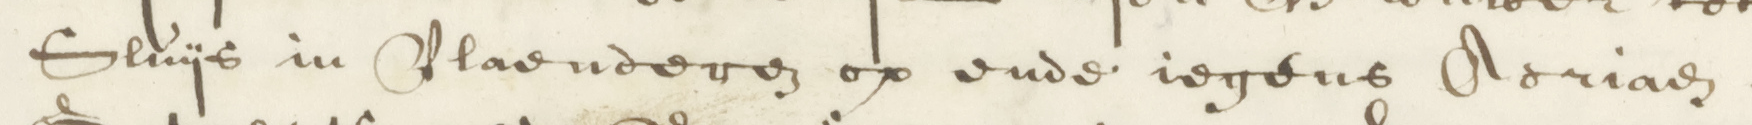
Sluijs in Vlaenderen op ende jegens Adriaen
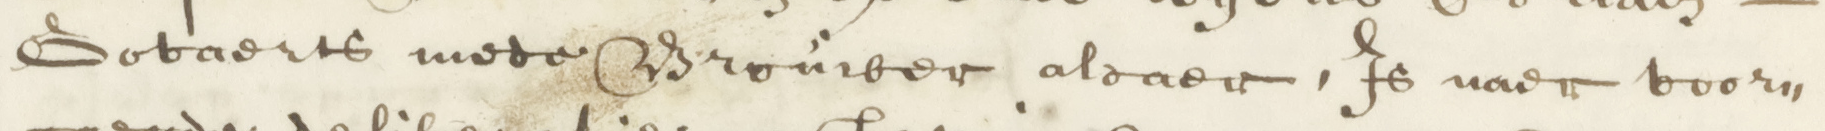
Govaerts mede Brouwer aldaer, Is naer voor„
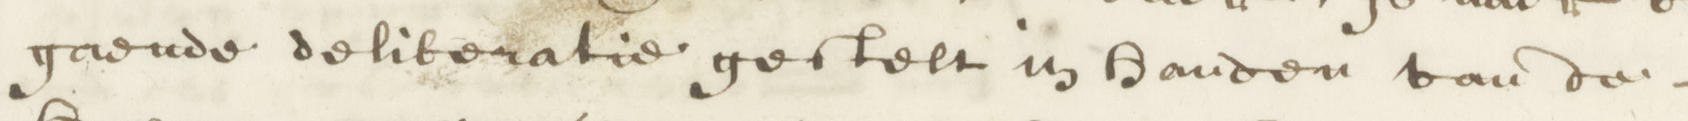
gaende deliberatie gestelt in handen van de
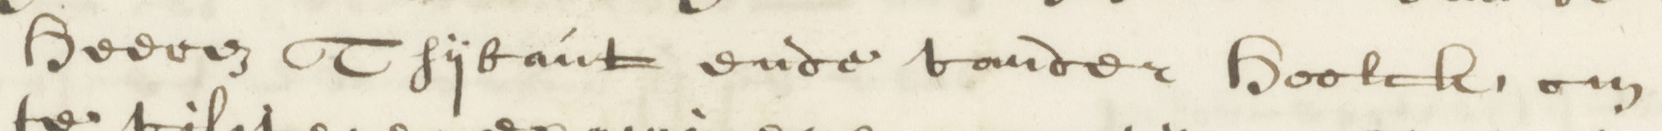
Heeren Thijbaut ende vander Hoolck, om
